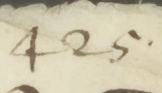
425
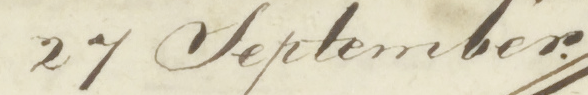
27 September
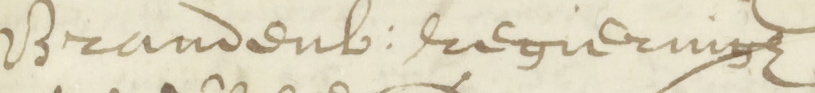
Brandenb: regieringh
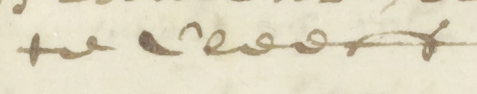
te Cleeff
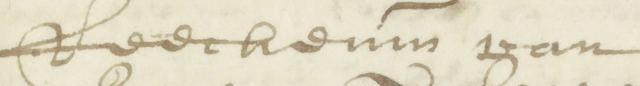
Reeckenin van
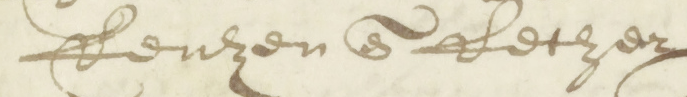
Renzen & Retzer
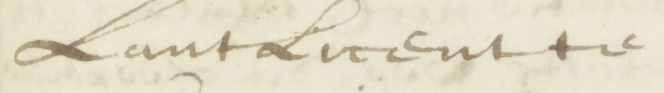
Lant Licent te
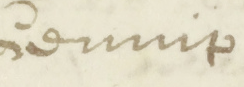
Gennip
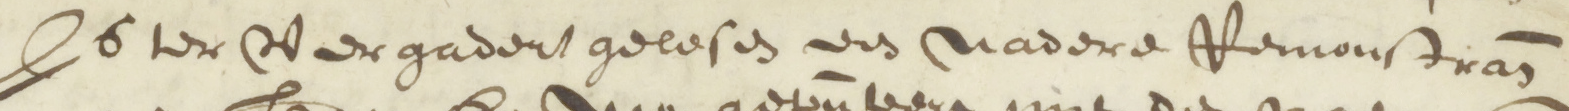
Is ter vergader gelesen een nadere Remonstran
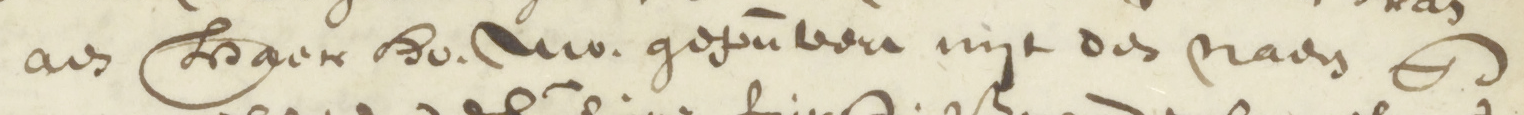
aen haer Ho.Mo. geputeer uijt den naem &
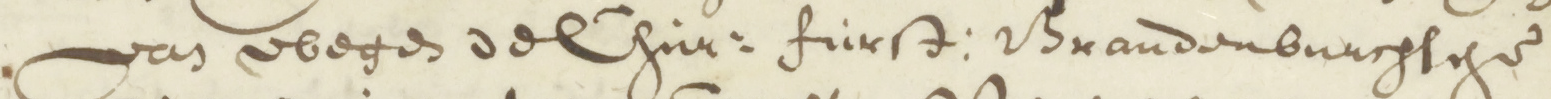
van wegen de Chur:furst: Brandenburchsche
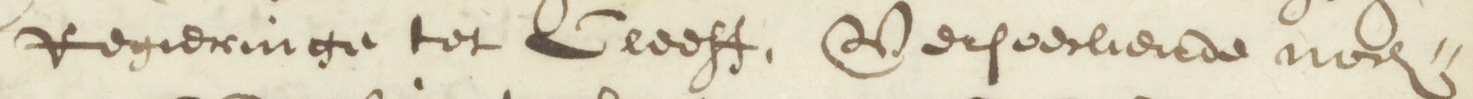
Regieringe tot Cleeff. Versoeckende noch„
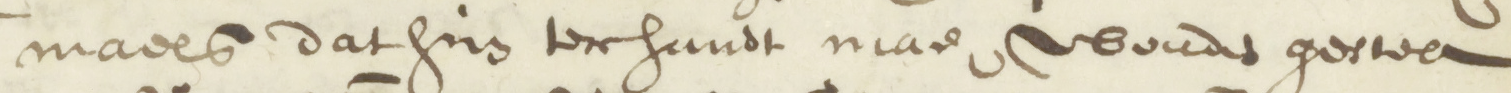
maels dat hun terhandt mach worden gestelt
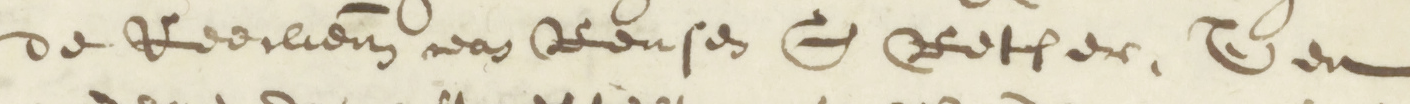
de Reecken van Rensen & Retser. Ten
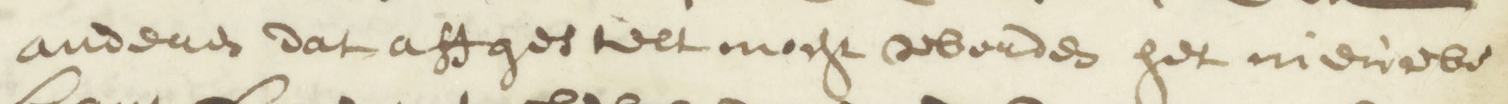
anderen dat affgestelt mocht werden het nieuwe
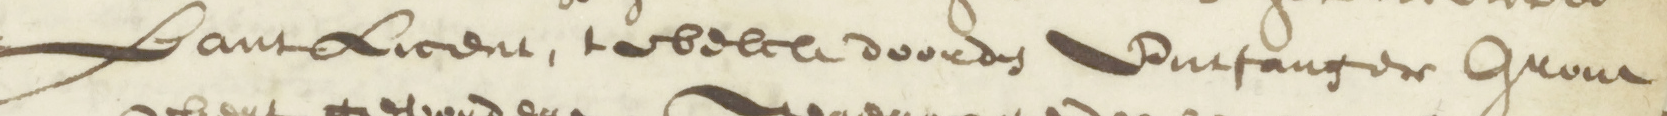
Lant Licent, twelck doorden Ontfanger Grone
